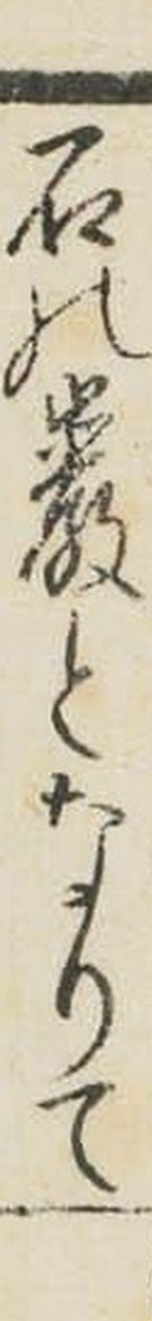石の巌となりて
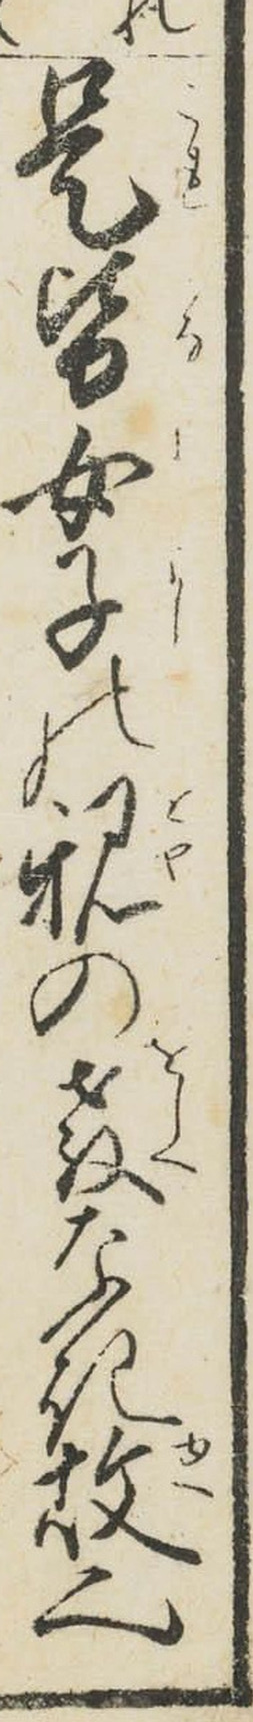是皆女子の親の教なき故也
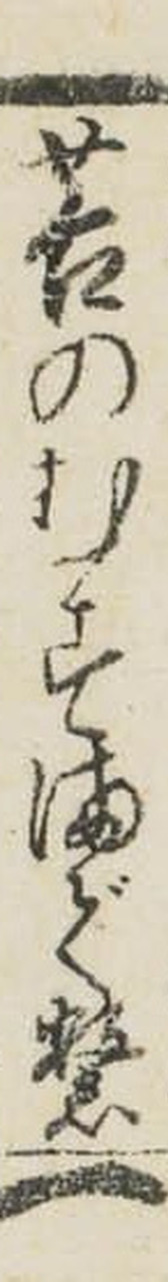苔のむすまで繁
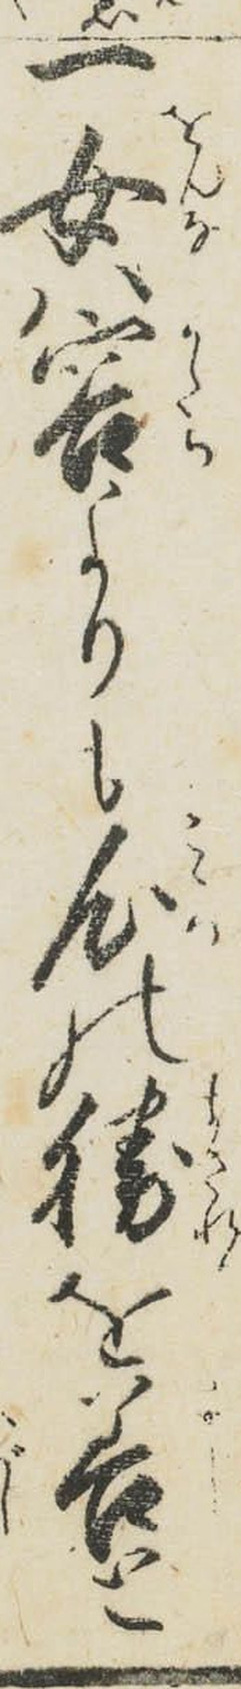一女は容よりも心の勝を善と
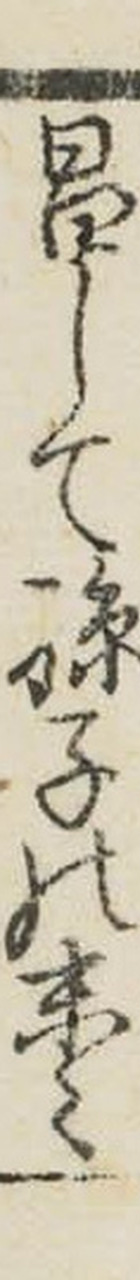昌して孫子の末々
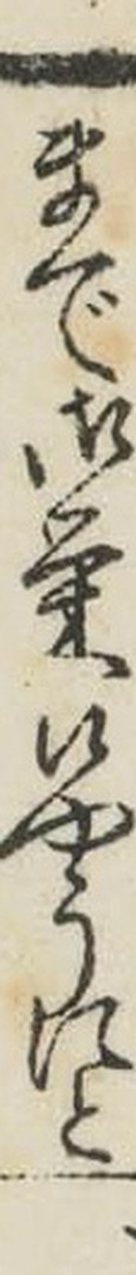まで御栄候やうにと
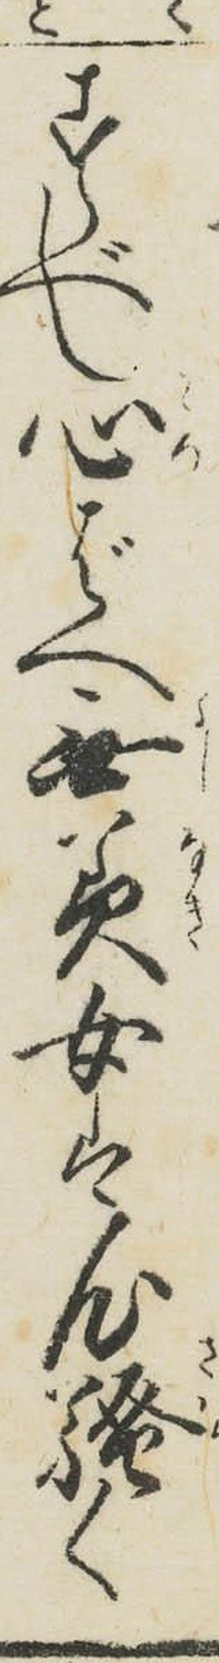すべし心ばへ無美女は心騒く
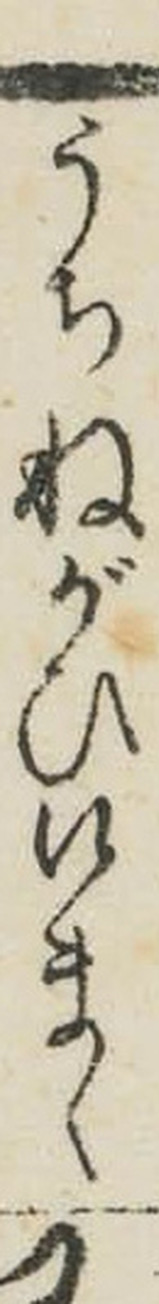うちねがひ候まゝ
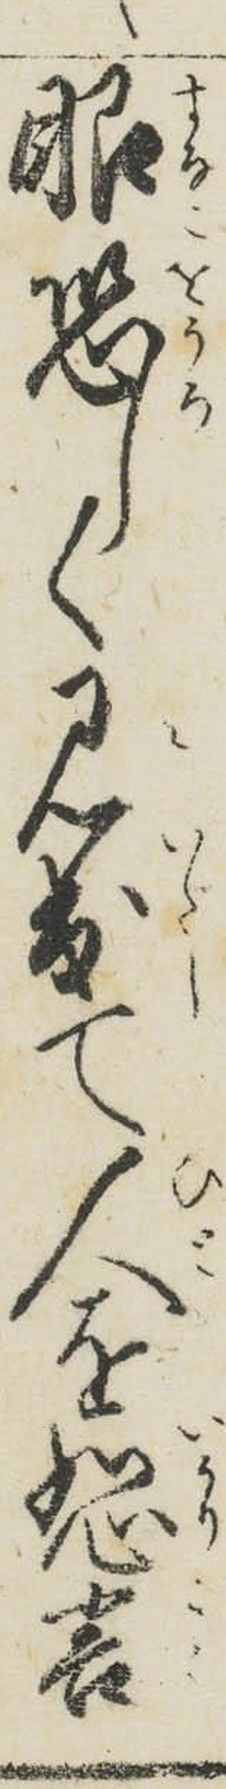眼恐しく見出て人を怒言
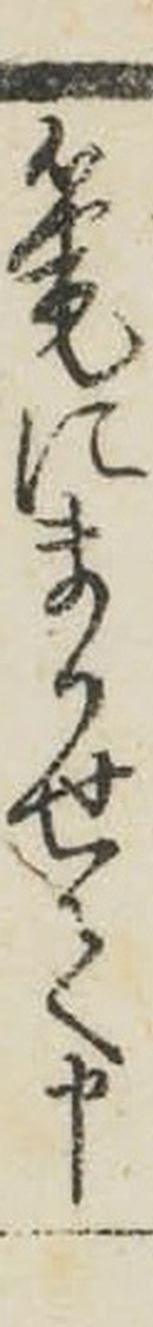筆にまかせて申
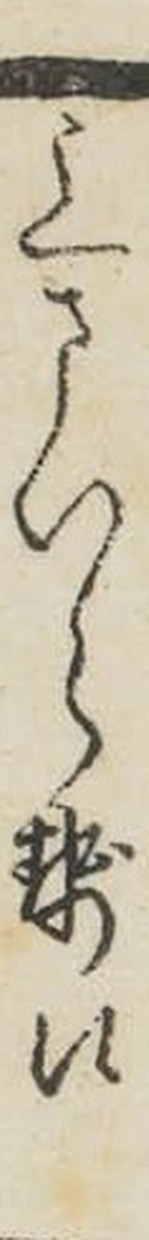上まいらせ候
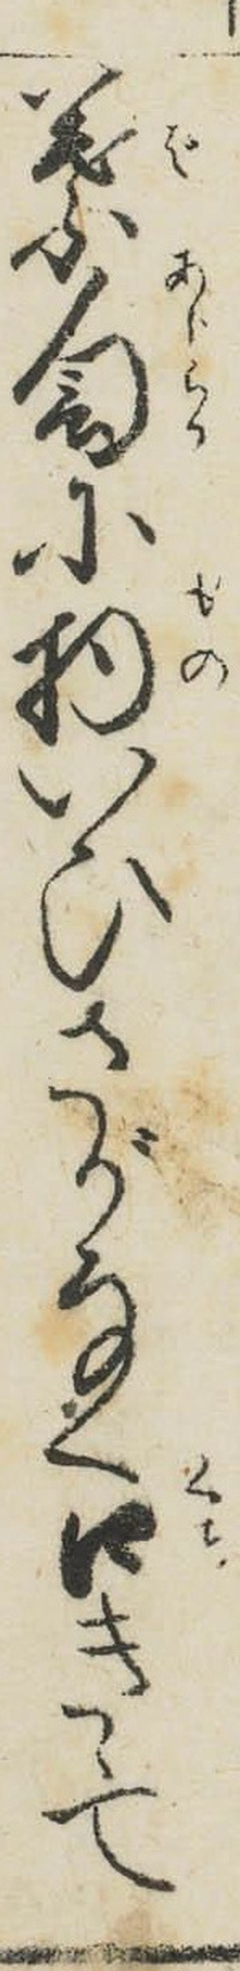葉訇に物いひさがなく口きゝて
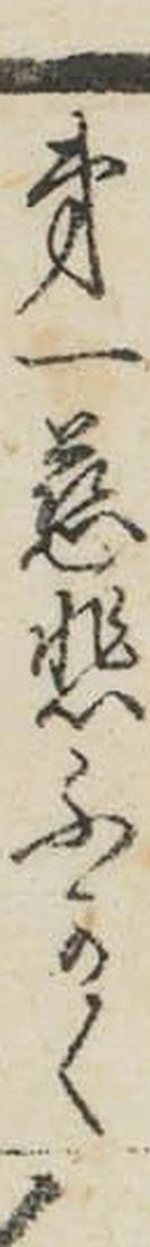第一慈悲ふかく
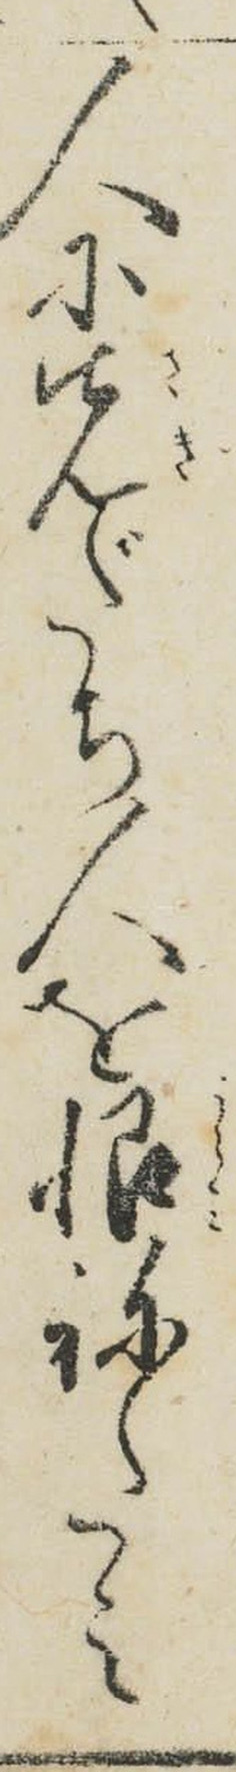人に先だち人を恨ねたみ
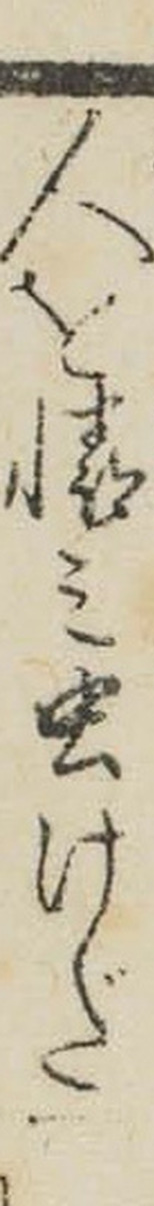人を憐み虫けだ
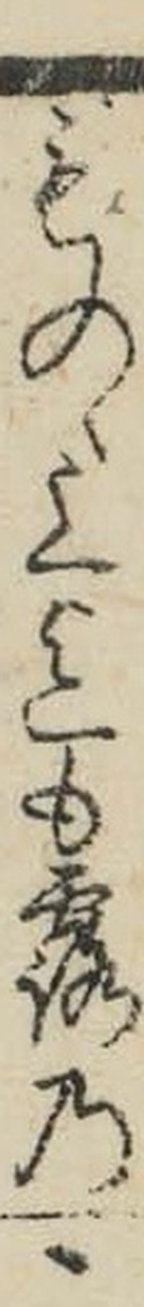ものゝ上迄も露の
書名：女大学
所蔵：東京学芸大学教育コンテンツアーカイブ
